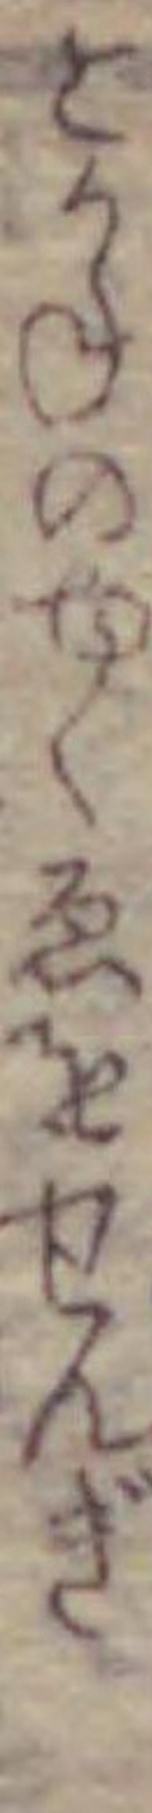こかねのゆくゑをせんぎ
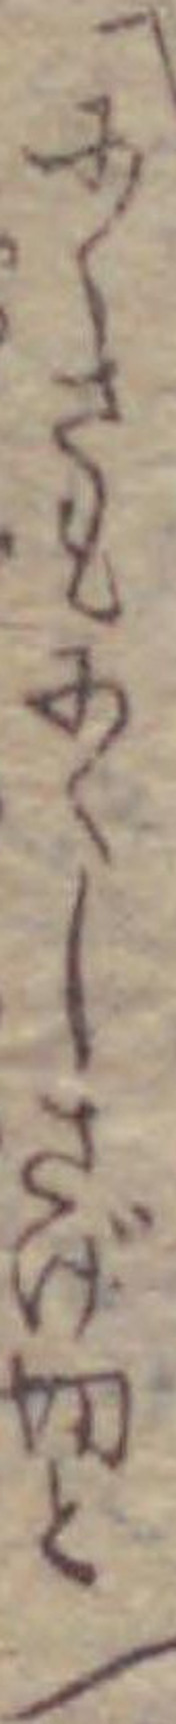〽にくさもにくしさげ切と
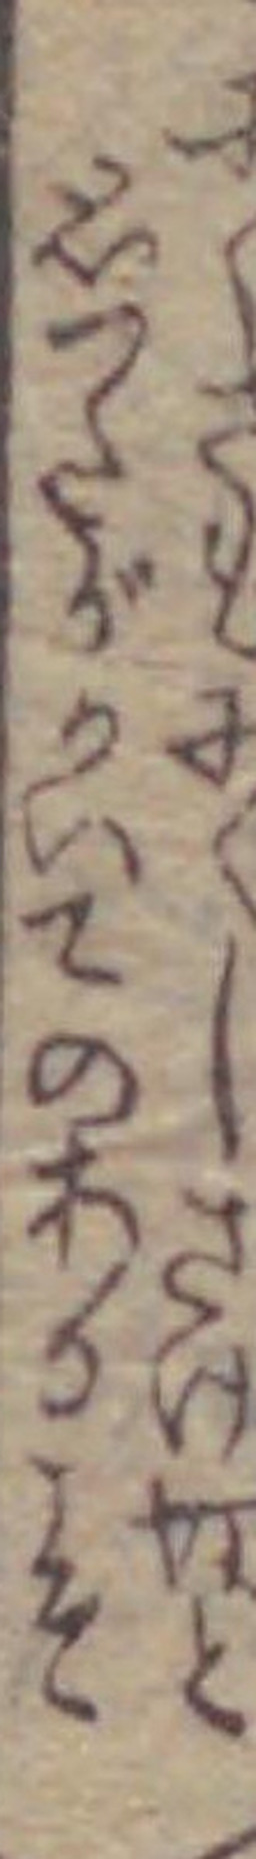思つたがかいてのあるにて
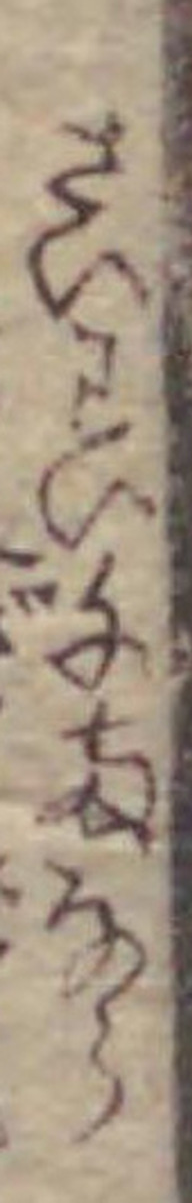さいわい千両なら
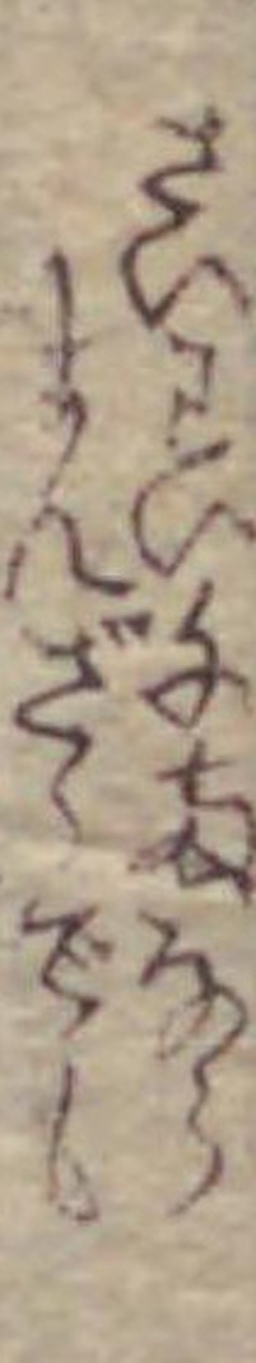まんざらでも
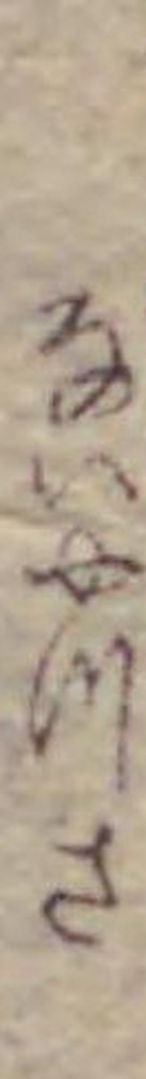ないやつさ
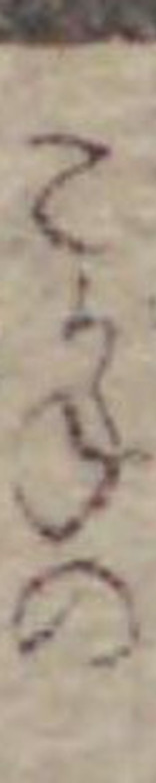こかねの
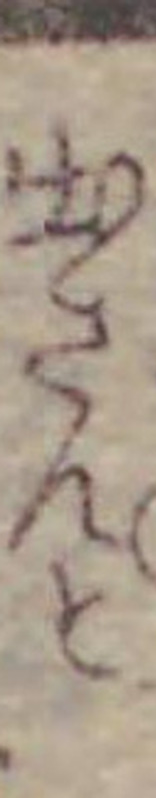出さんと
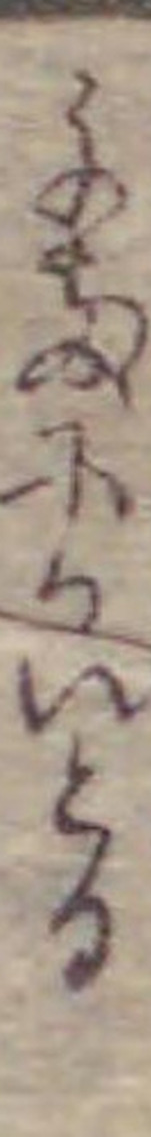千両にかいとる
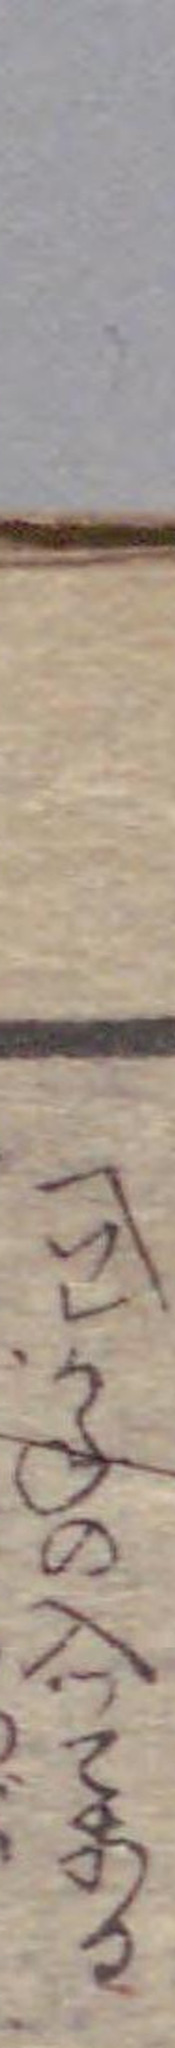〽ソレかねの入つてある
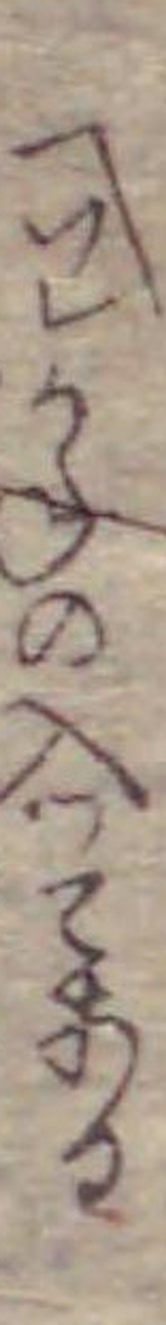〽ソレかねの入つてある
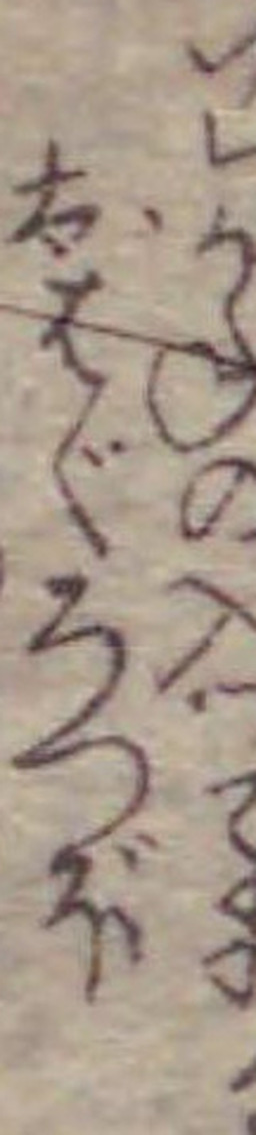おはぐろつぼ
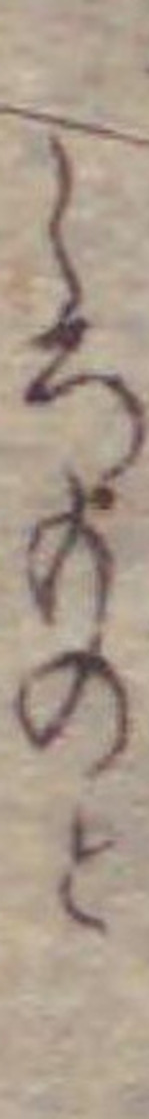しろものと
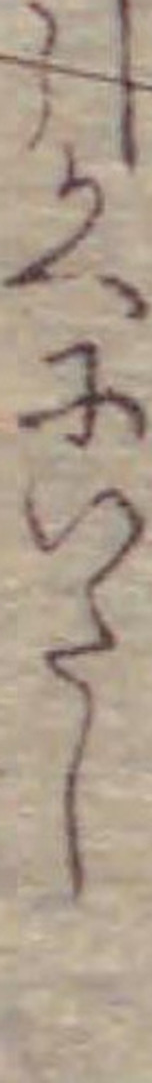引かへにいたし
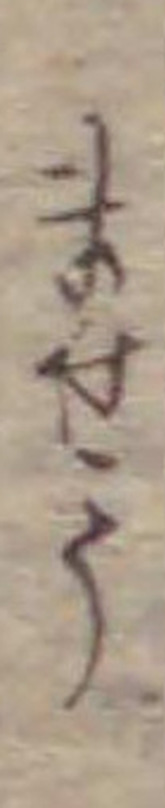ませう

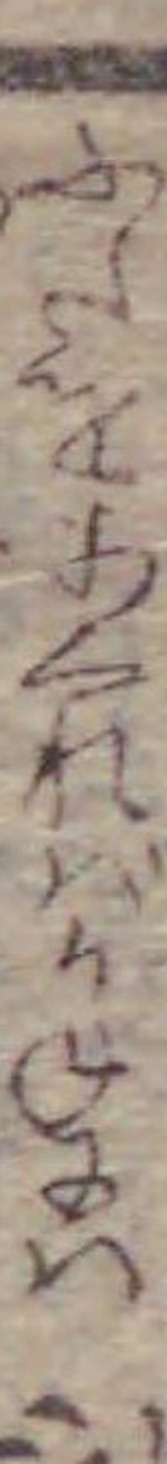ふたをあくればかねには
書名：万物小遣帳 : 2巻
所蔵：国立国会図書館 National Diet Library, JAPAN
